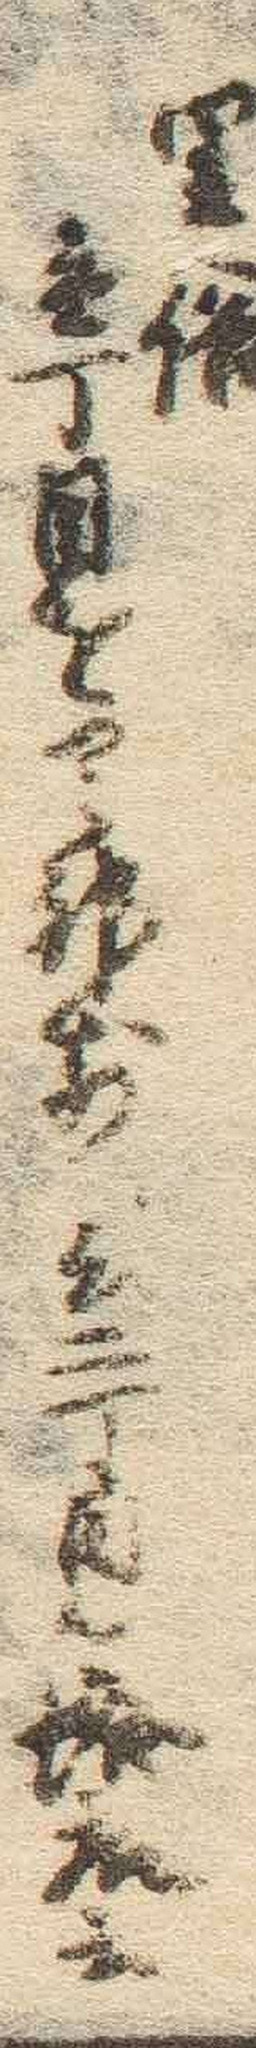壱丁目を天神前ト云二丁目捨店云
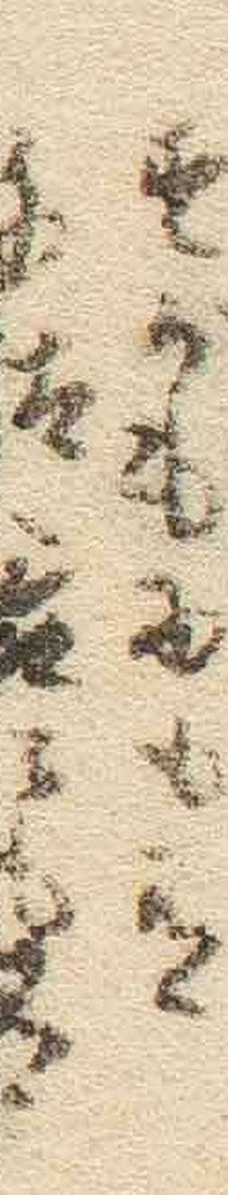千駄谷にも有
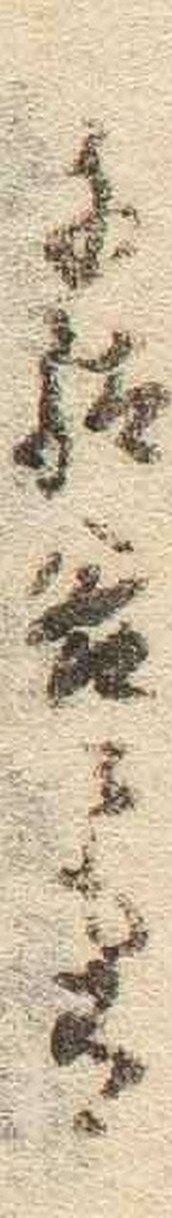千駄谷にも有
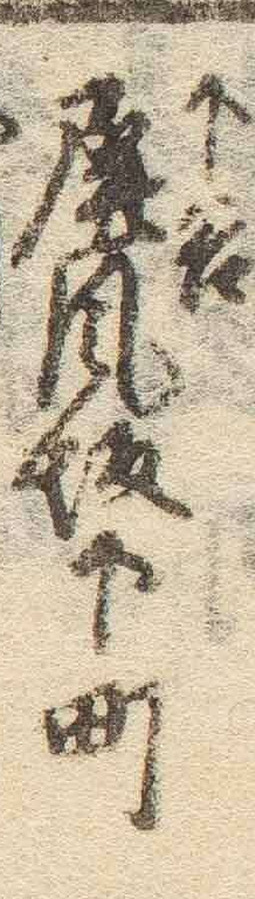屏風坂下町
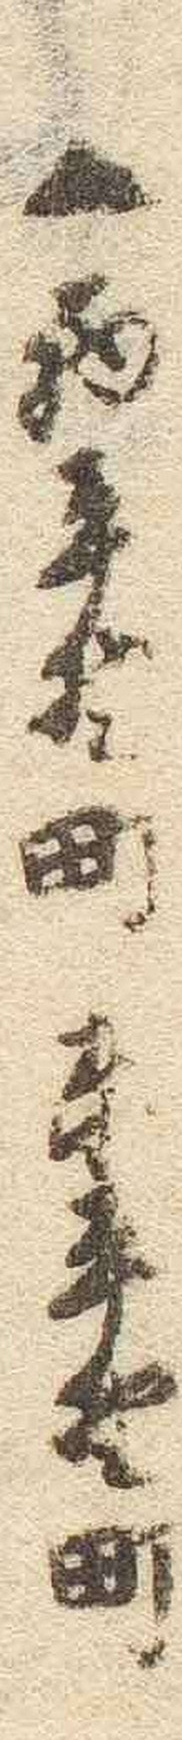▲西平野町東平野町
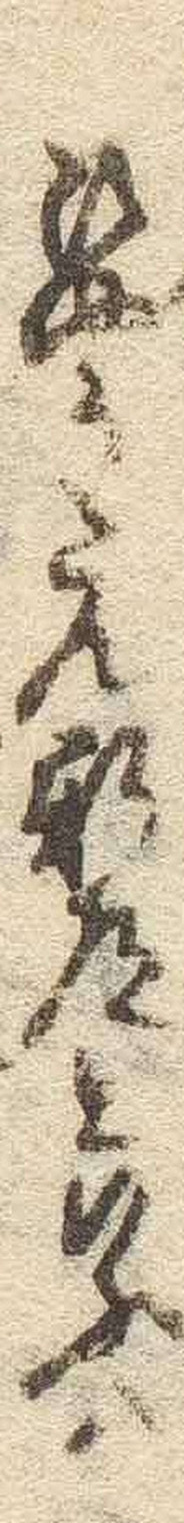ひやうたん新道といふは
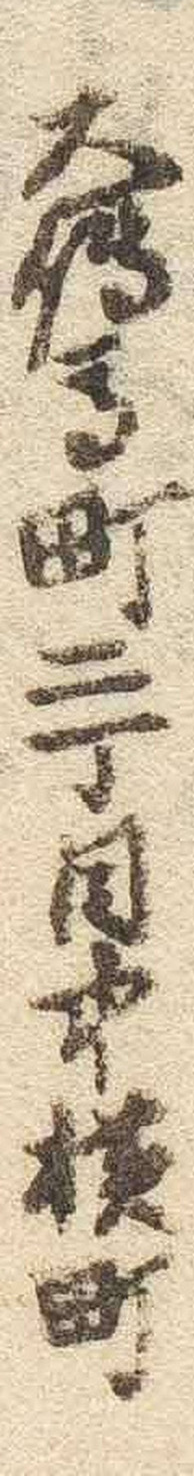大伝馬町二丁目中横町
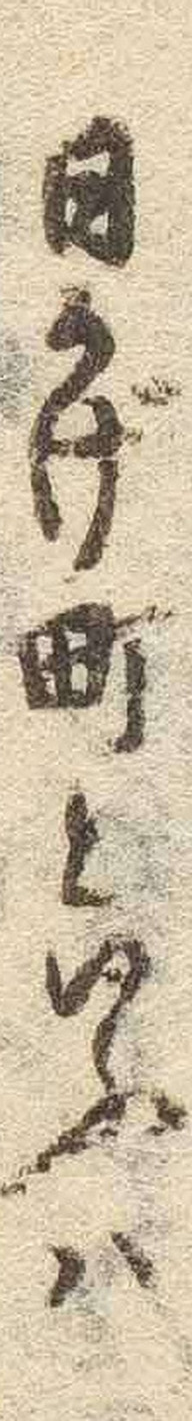日かげ町といふは
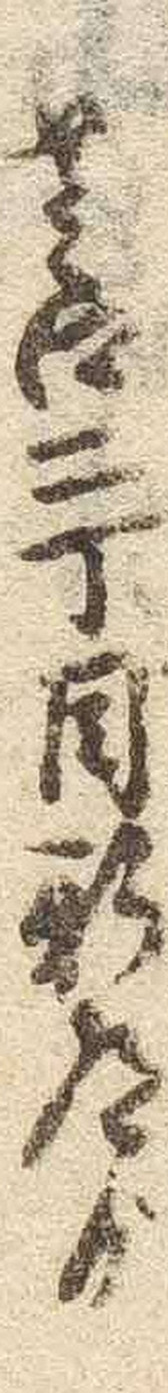芝口二丁目新道ゟ
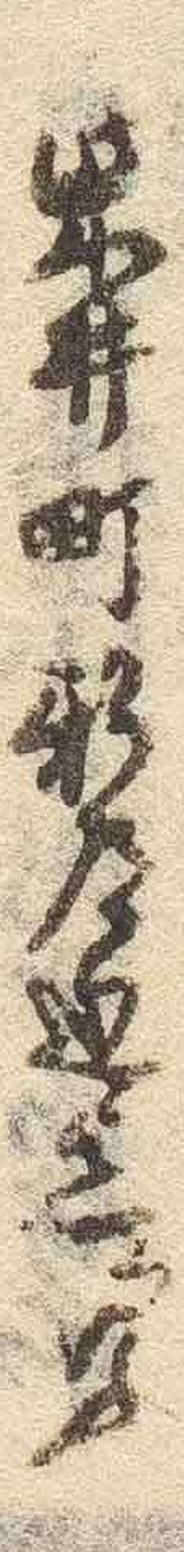柴井町新道辺迄いふ
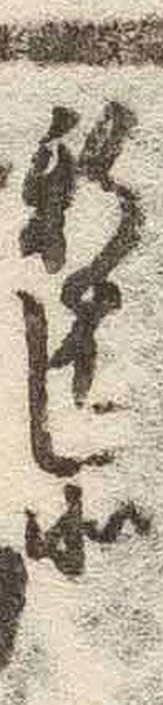新はし北
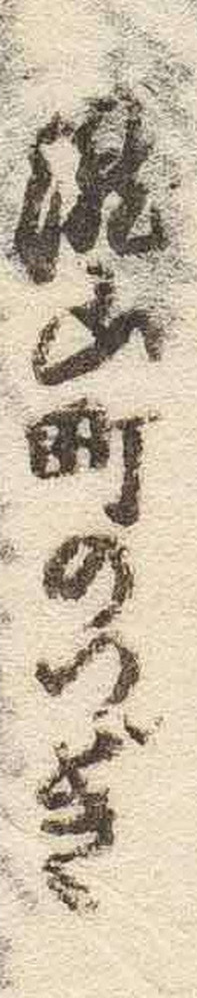元町竹町のつゞき
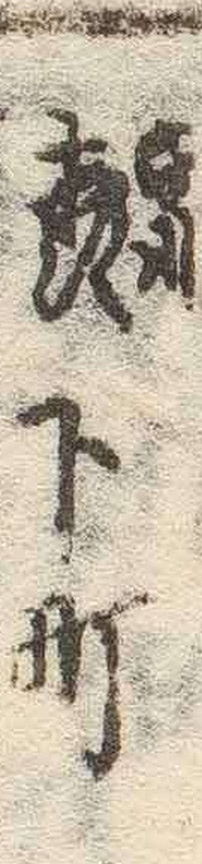森下町
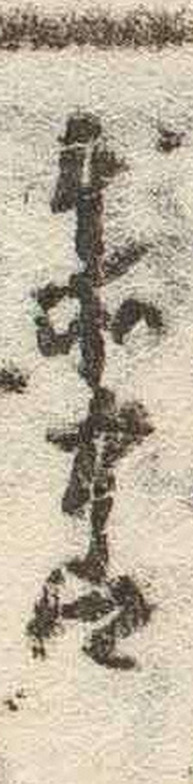本所中郷
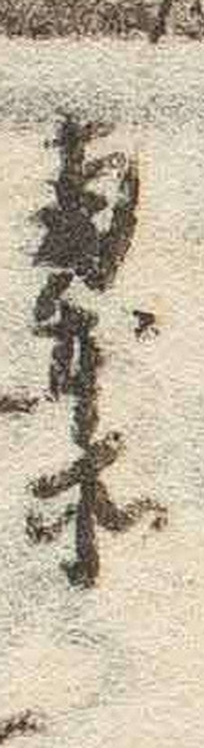南本所
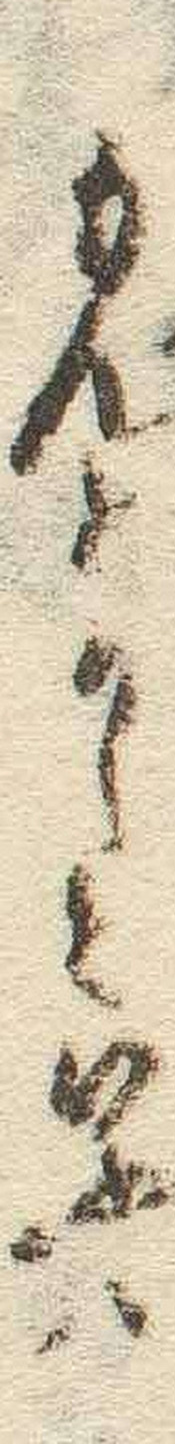もんとかしといふは
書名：江戸町独案内
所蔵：東京学芸大学附属図書館 国文学研究資料館
